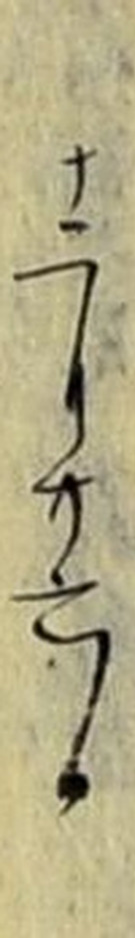十二月廿六日

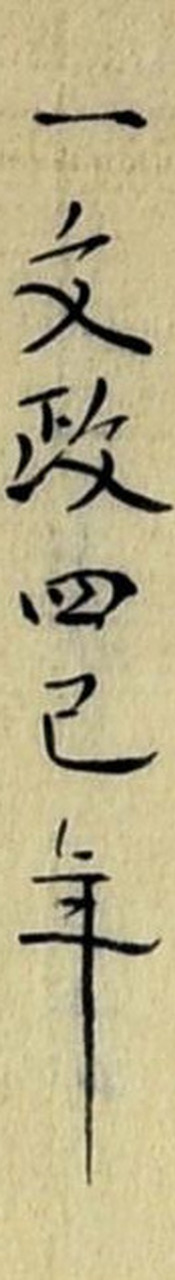一文政四巳年
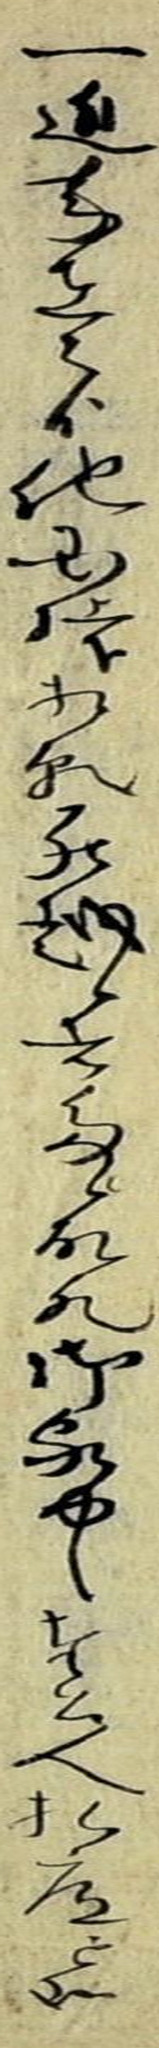一近年在々ゟ他国挊相願罷越候者多候故歟御家中奉公人払底に候処
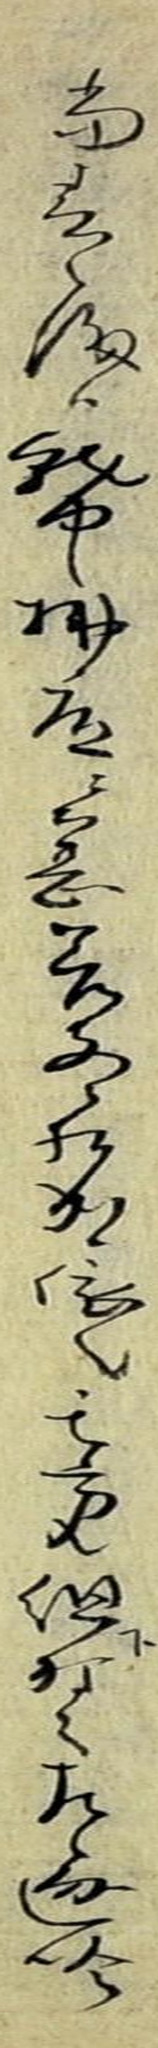当春之儀は就中払底に而甚差支に相成候依之其方共組下村へ左之通吟
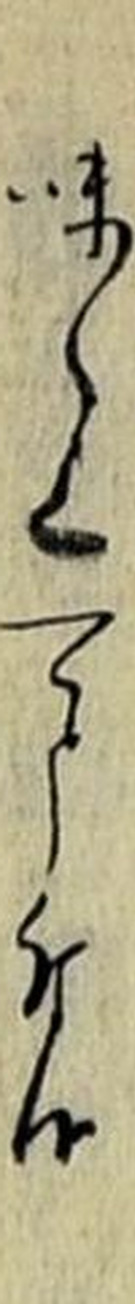味之上可申付候
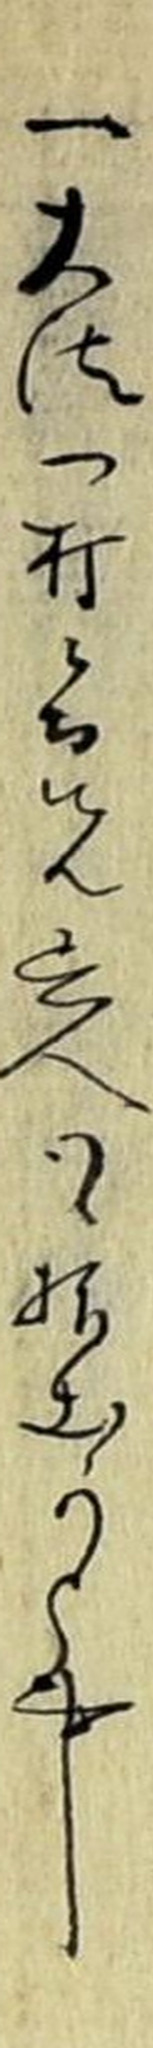一大法一村に而先壱人つヽ指出可申事
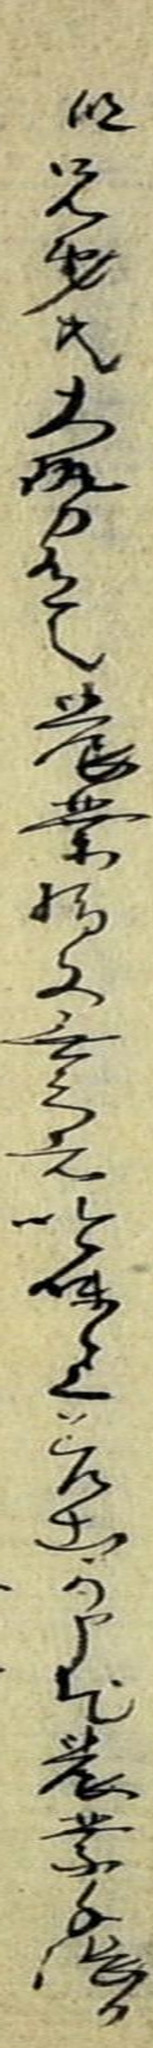但兄弟共大勢有之農業指支無之者吟味之上差出可申尤農業手張り
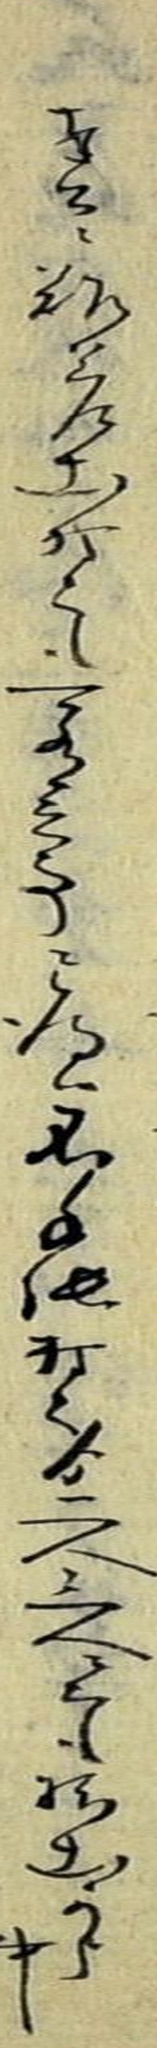奉公に難差出村々も可有之事に候得は不手張村々ゟ二人三人にても指出可申事
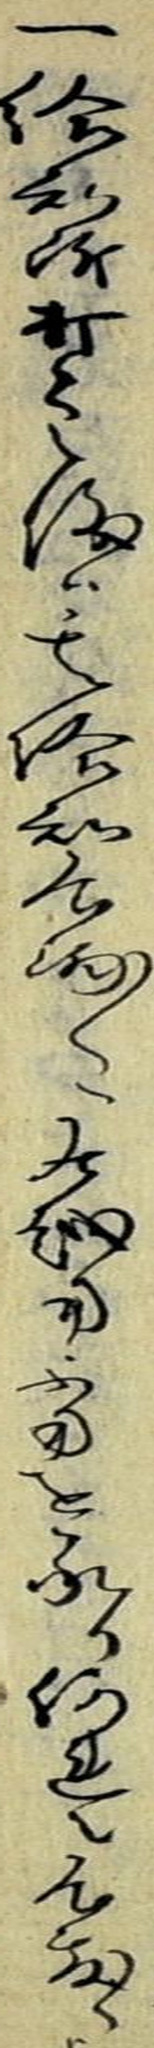一給知附村々之儀は其給知屋鋪〳〵へ罷越用不用を承り何連之屋敷へ被
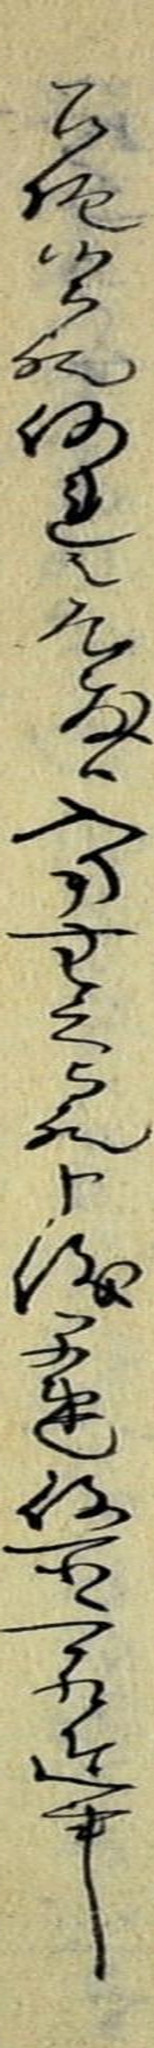召抱候と歟何連之屋敷は入用無之と歟申儀早速役所へ可相達事
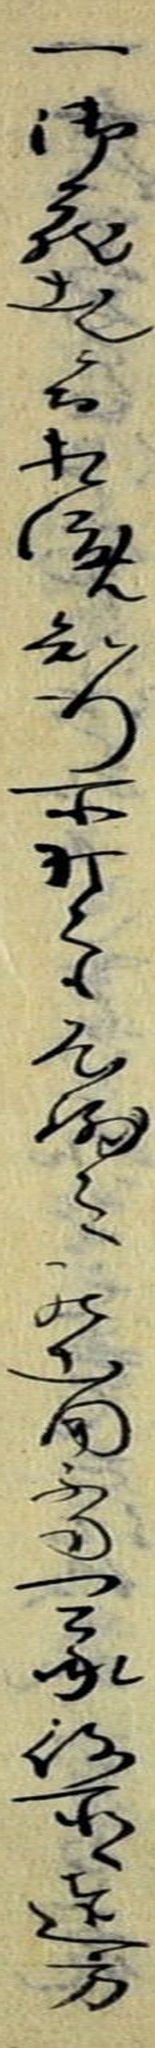一御蔵出しに而相渡ル知行所村々も屋鋪〳〵へ罷出用不用可被承役所へ達方
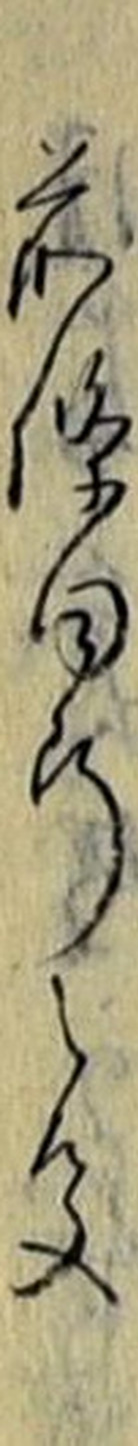前條同断之事
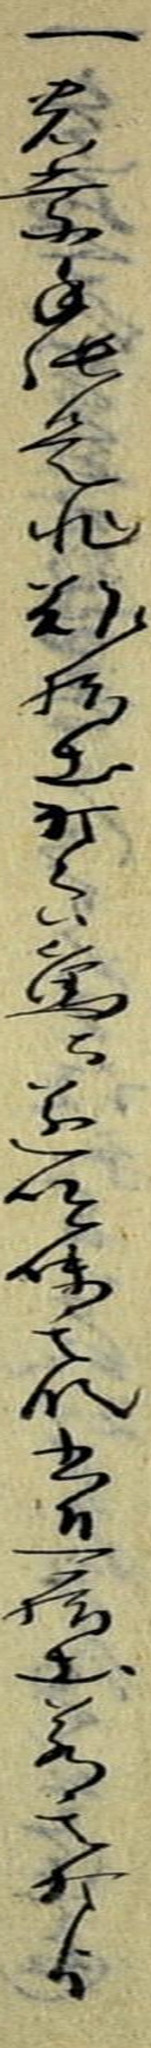一着桑手張是非難指出村々は篤と遂吟味其段書付可指出若其村より
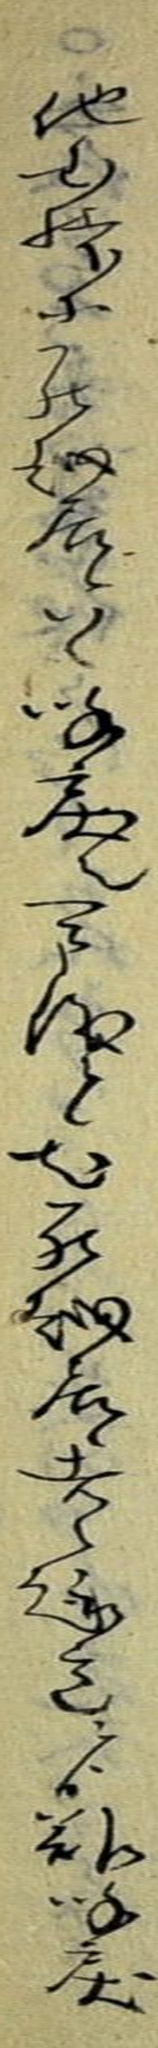他国挊等罷越居候はヽ呼戻し可申儀に候尤罷越居候者之趣意にゟ難呼戻
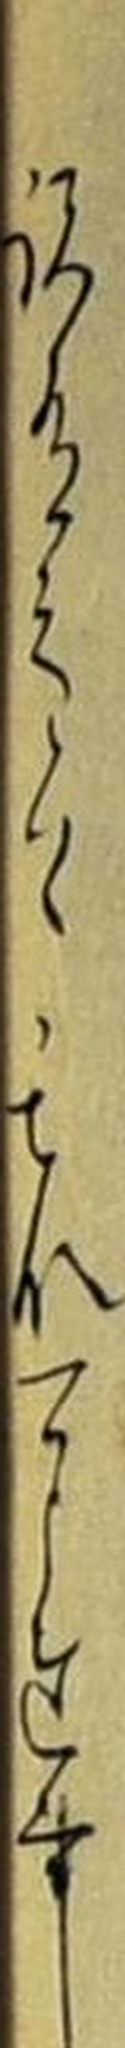訳有之候はゝ其段可申達事
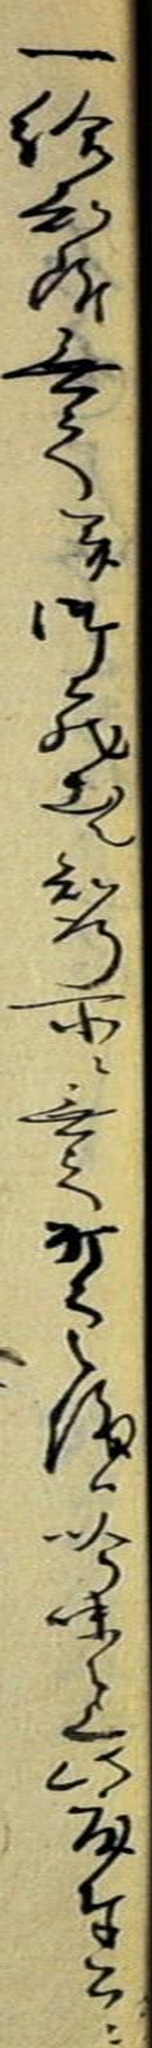一給知附無之并御蔵出し知行所に無之村々之儀は吟味之上此度奉公に
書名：命令之部 四
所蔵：福井県文書館 Fukui Prefectural Archives
